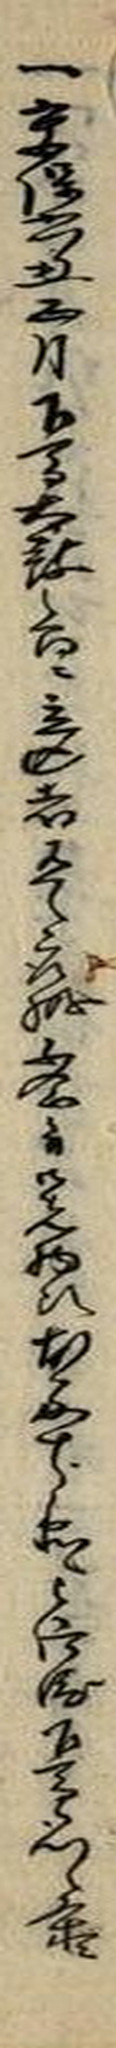一享保六丑年正月下馬太鼓之間ニ立込者有之取扱不念ニ付御先物頭本多十郎兵衛へ被仰渡下馬御門之条ニ
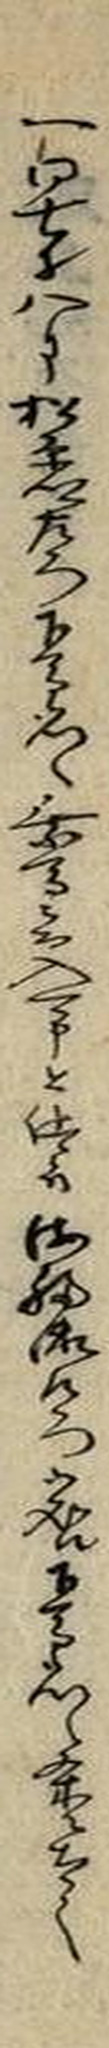一同七寅八月松原郷左衛門下馬御門へ乗馬ニ而入可申と仕候ニ付海福瀬左衛門御咎下馬御門之条ニ出之
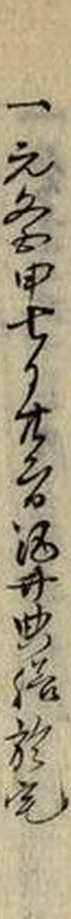一元文五申七月廿二日酒井典膳於宅
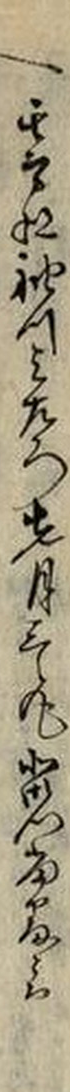其方組袖川与左衛門先月三之丸北御門当番ニ而
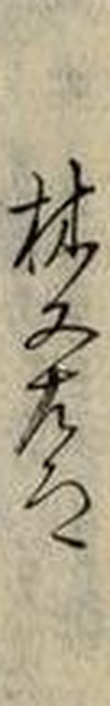林左衛門へ
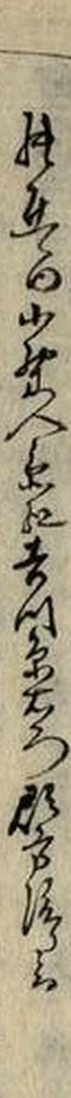罷在候内小栗八兵衛組吉川糸右衛門郡方渡りニ而
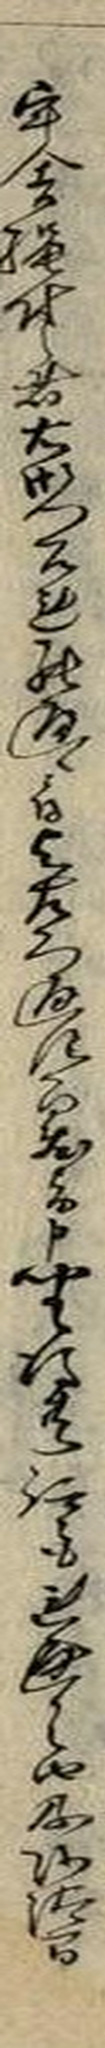牢舎縄付之者右御門召連罷通候ニ付与左衛門通行間敷旨申聞候得共跡ニも連通り之由及沙汰間
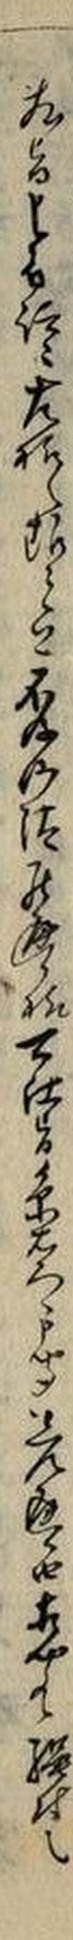敷旨申候ニ付跡々左様之趣ニ候ハヽ不及沙汰罷通候様可仕旨糸右衛門へ申聞差通候由相聞候縄付之
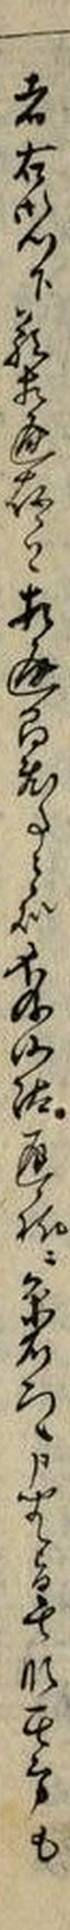者右御門下難相通存候ハヽ相通間敷事ニ候処不及沙汰通り候様ニ糸右衛門へ申聞候旨其段其方も
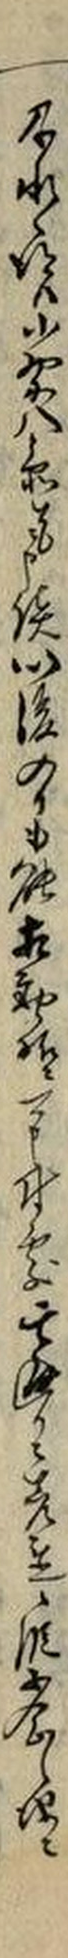及承候得ハ小栗八兵衛とも申談以後〆りも能相勤候様ニ可申付候処其通りニ差置候段不念之儀ニ
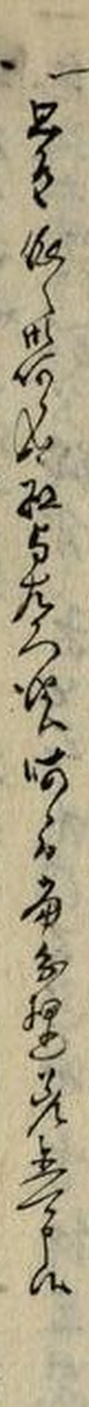思召候依之御呵被成候組与左衛門儀ハ呵ニ付当分押込差置可申候
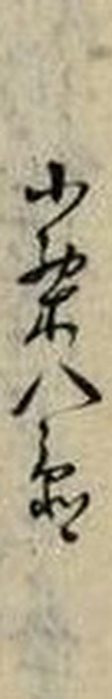小栗八兵衛へ
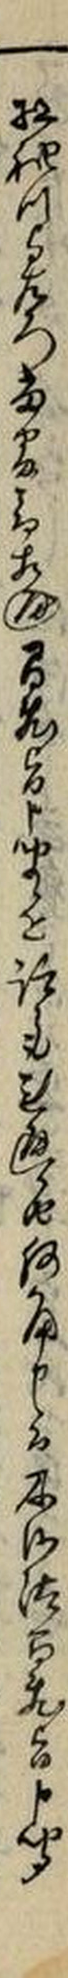組袖川与左衛門当番ニ而相通間敷尤旨申聞候を跡ニも連通候由何角申候而及沙汰候間敷旨申聞
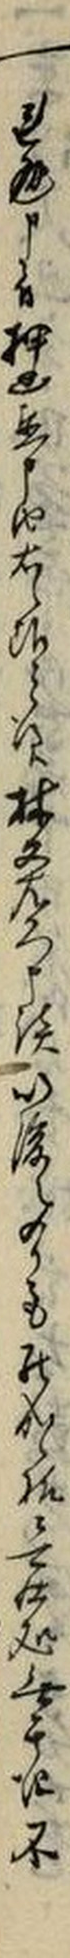連通申ニ付押込置申由右之趣ニ候得ハ林又左衛門申談以後之〆りニも罷成候様ニ可仕処無其儀不
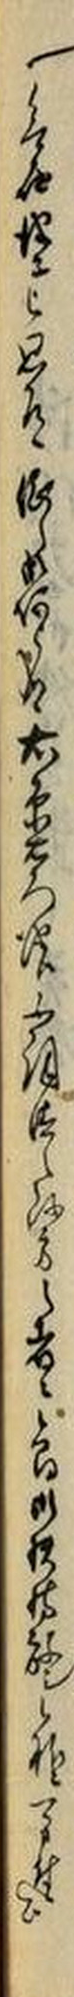参届儀ニ被思召候依之如何被成候右糸右衛門儀ハ不調法之致方之者ニ候間御扶持放シ候様ニ可申付候以上
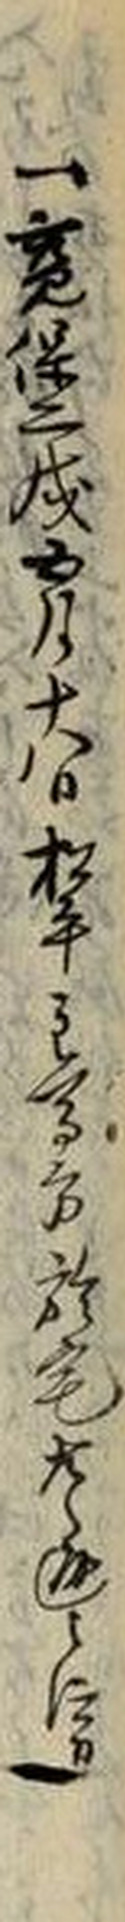一寛保二戌五月十八日松平主馬方於宅左之通被仰付
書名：御門御櫓之部
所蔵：福井県文書館 Fukui Prefectural Archives
